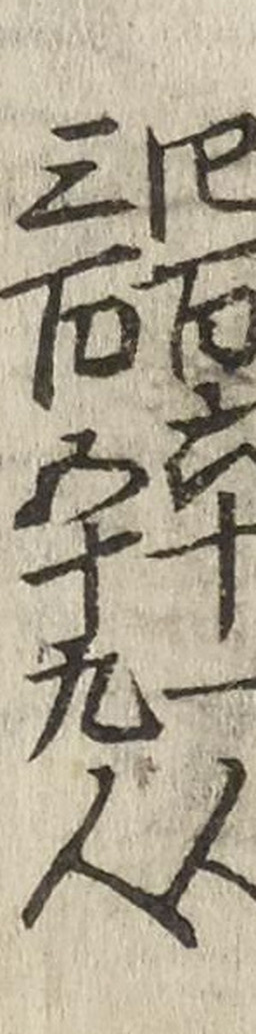女三百五十九人
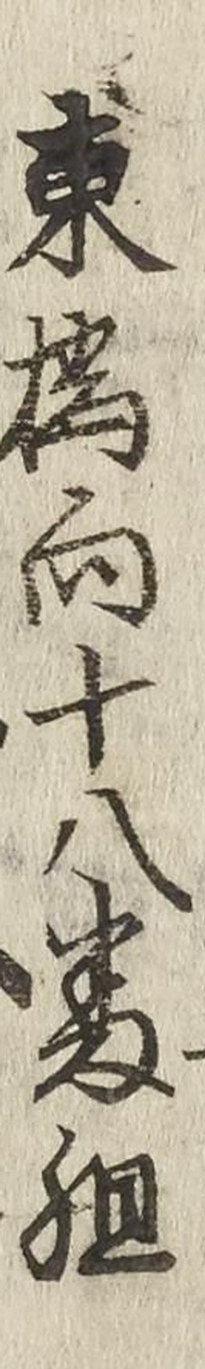東橋向十八番組
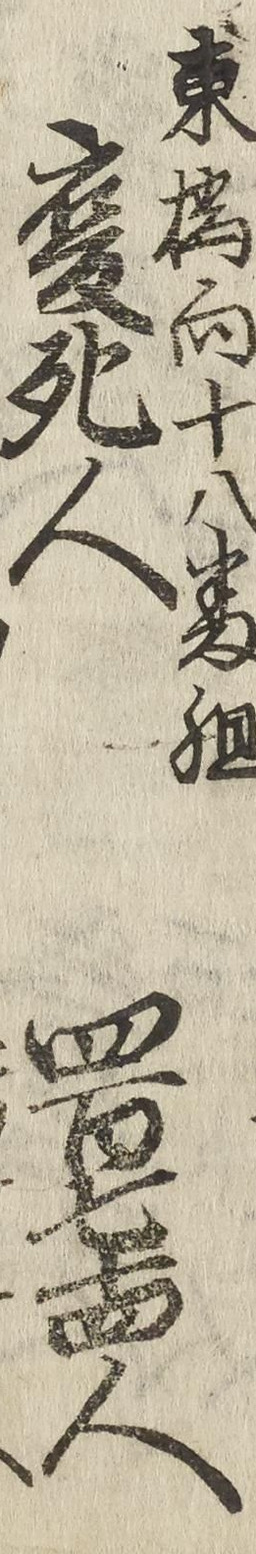変死人四百七十四人
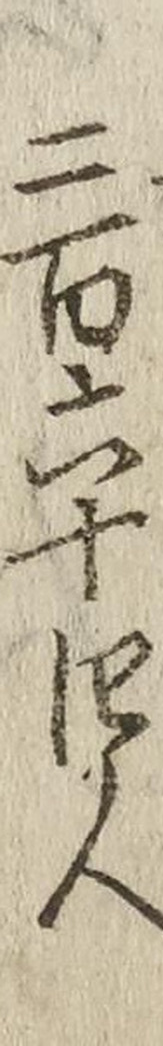女二百六十四人
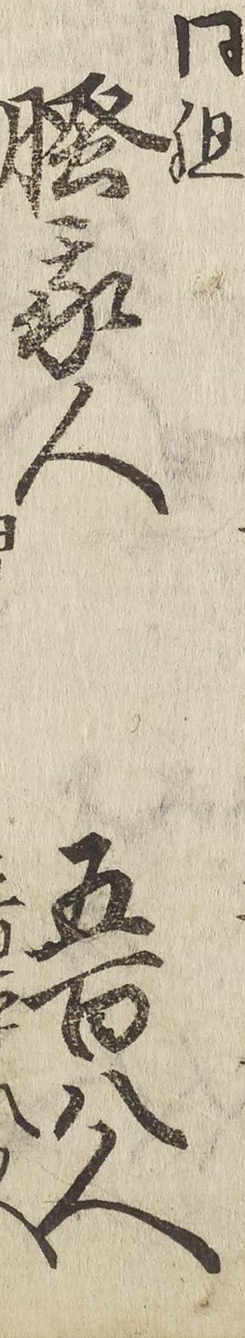怪我人五百八人
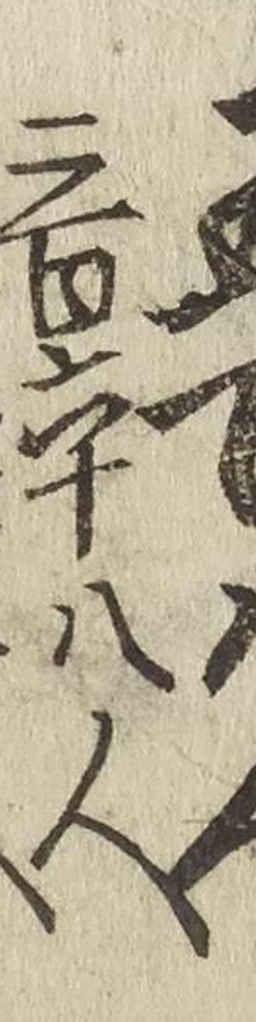内男二百六十八人
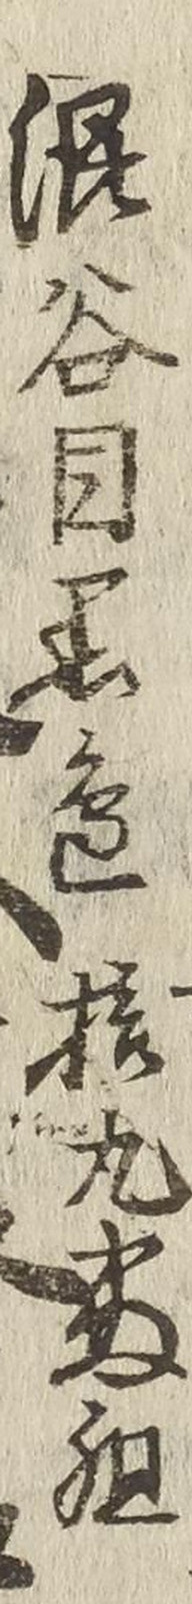渋谷目黒辺拾九番組
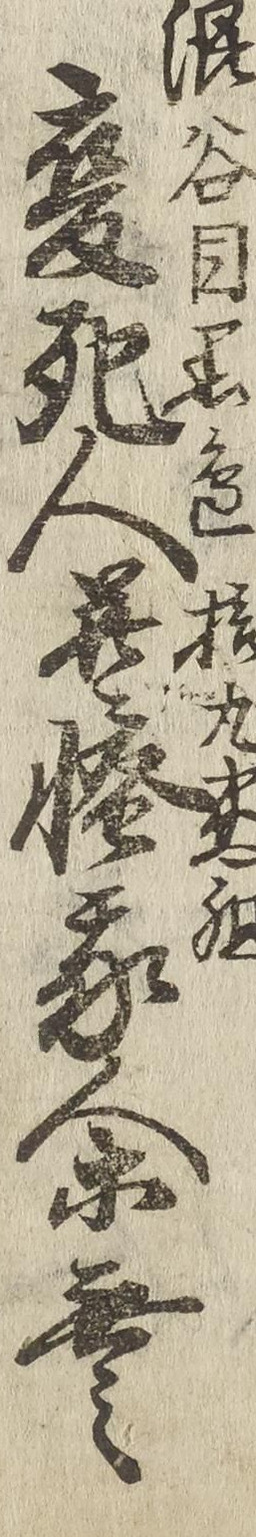変死人并怪我人等無之
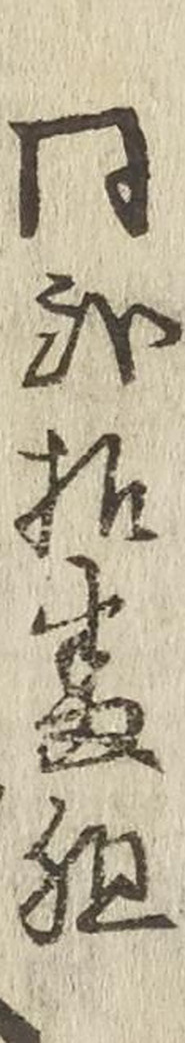同弐拾番組
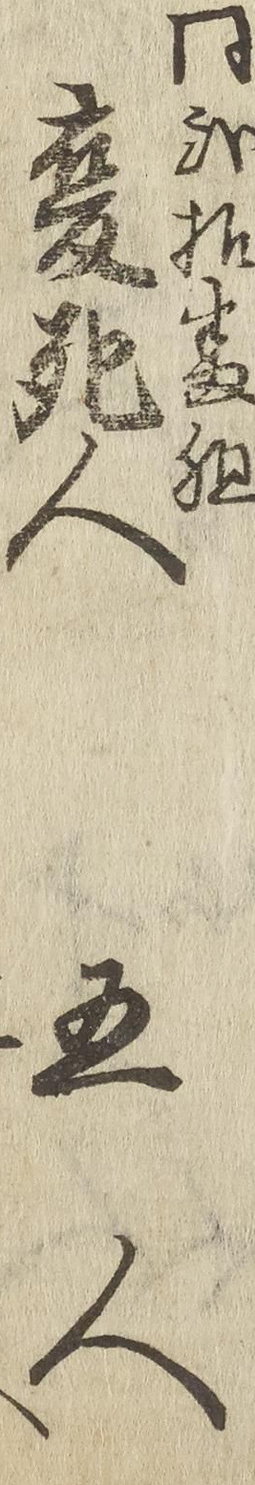変死人五人
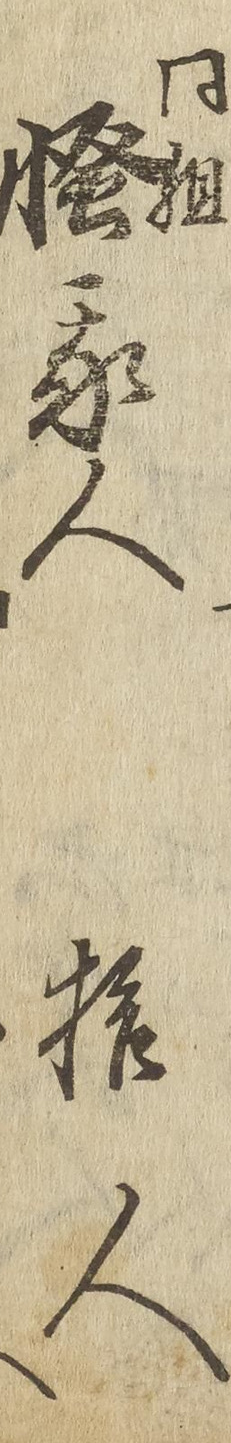怪我人拾人

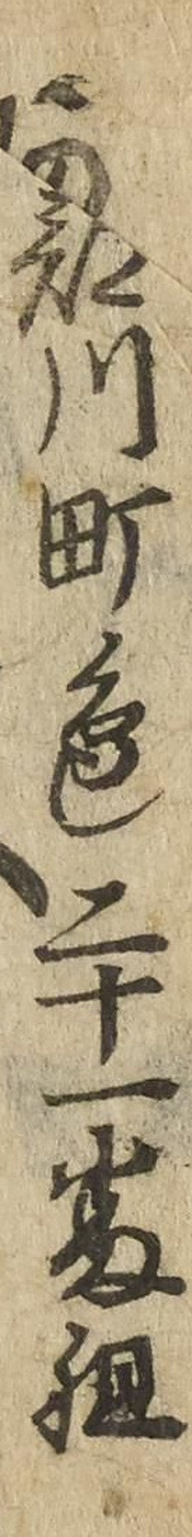阿部川町辺二十一番組
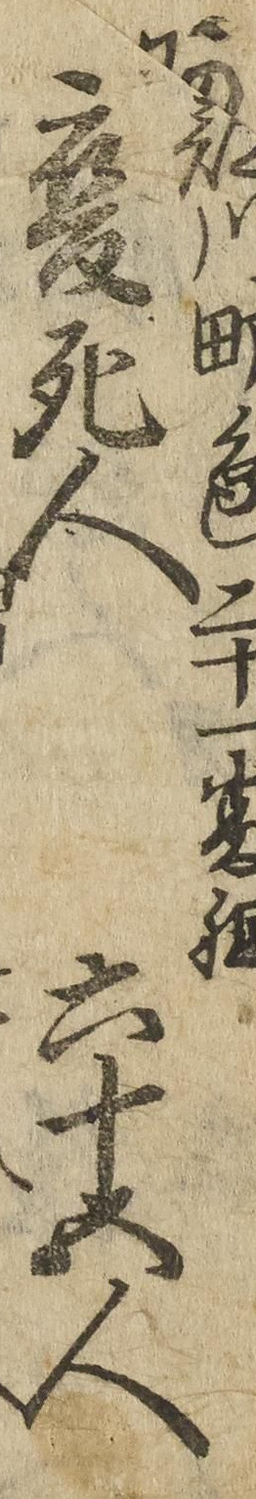変死人六十五人
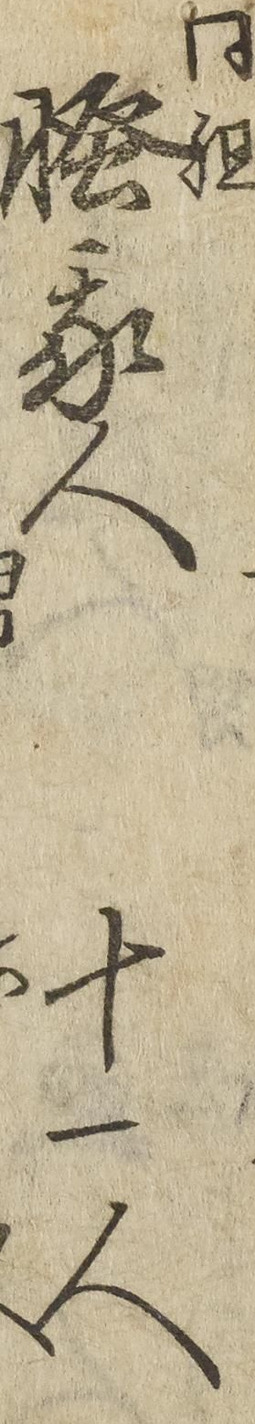怪我人十一人
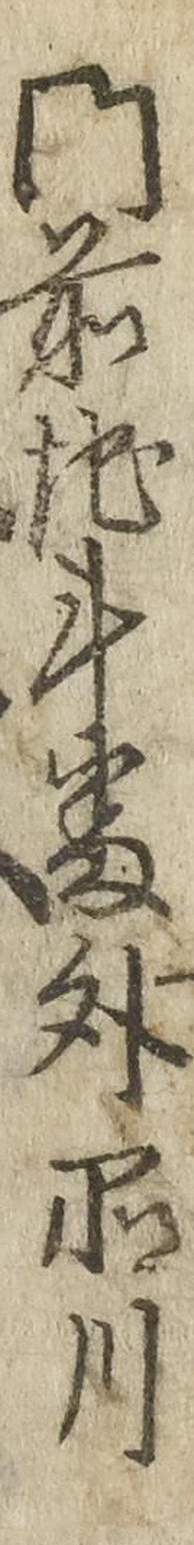門前地斗番外品川
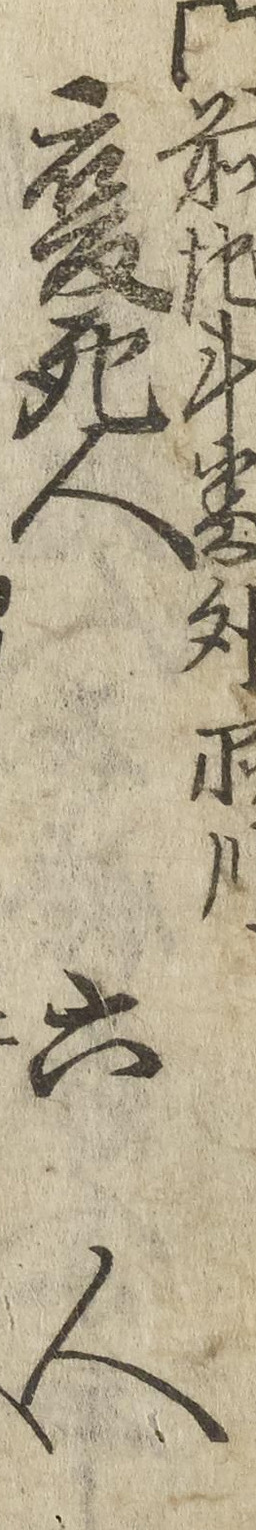変死人六人
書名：地震出火　男女死人怪我人書上之寫
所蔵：東京大学地震研究所図書室 Earthquake Research Institute Library, The University of Tokyo, JAPAN
